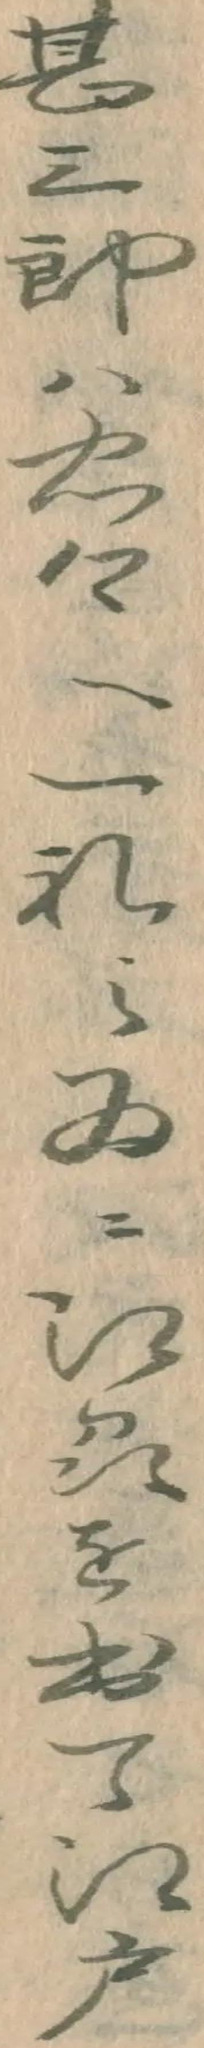甚三郎は忠郷へ一礼之ゐに江州を出て江戸
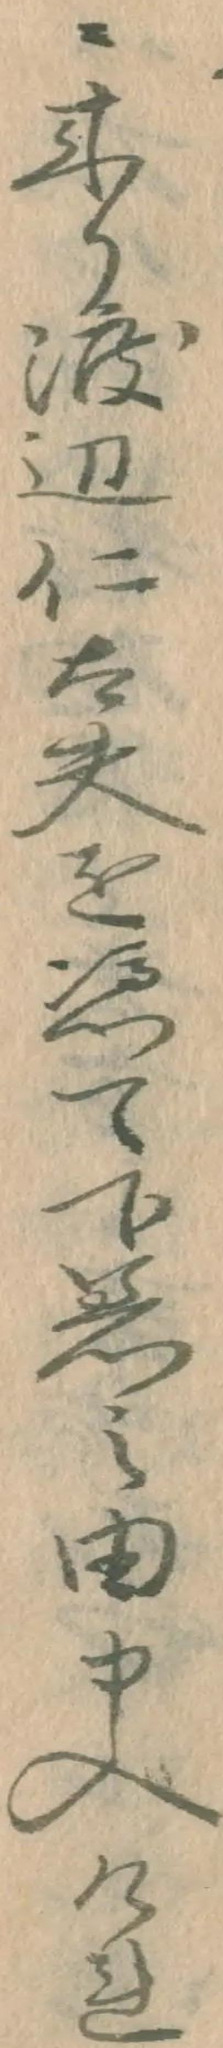に来り渡辺仁太夫を慿て下着之吉申入け連

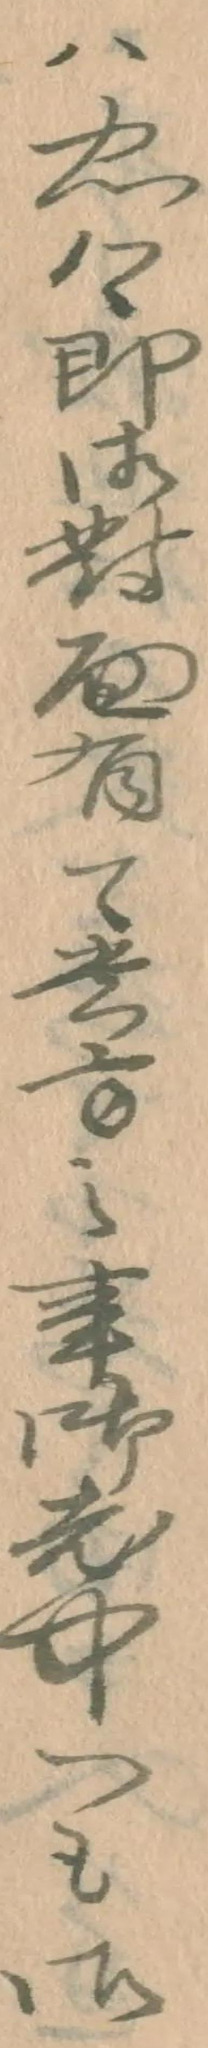は忠郷即御対面有て貴方之事御老中へも御
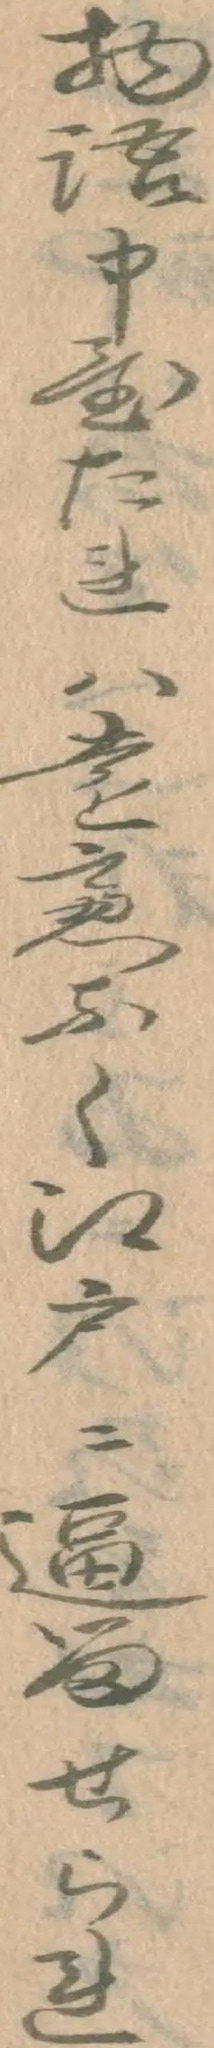物語申置た連は遠慮なく江戸に逗留せら連
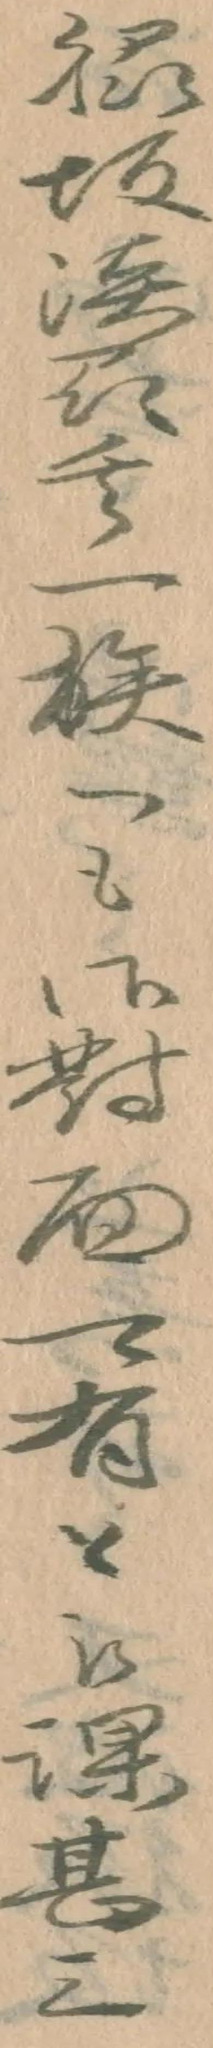脇坂淡州其一族へも御対面可有と被課甚三
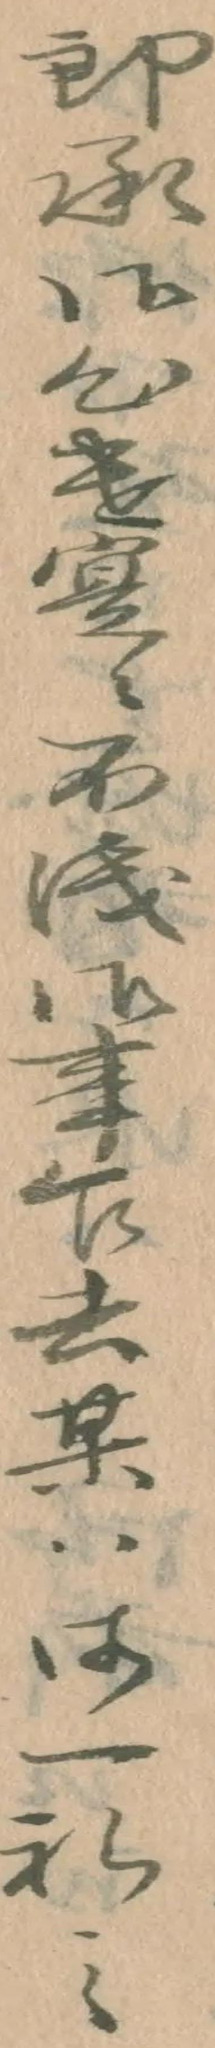郎承御心遣寔に不浅御事乍去某は御一礼之
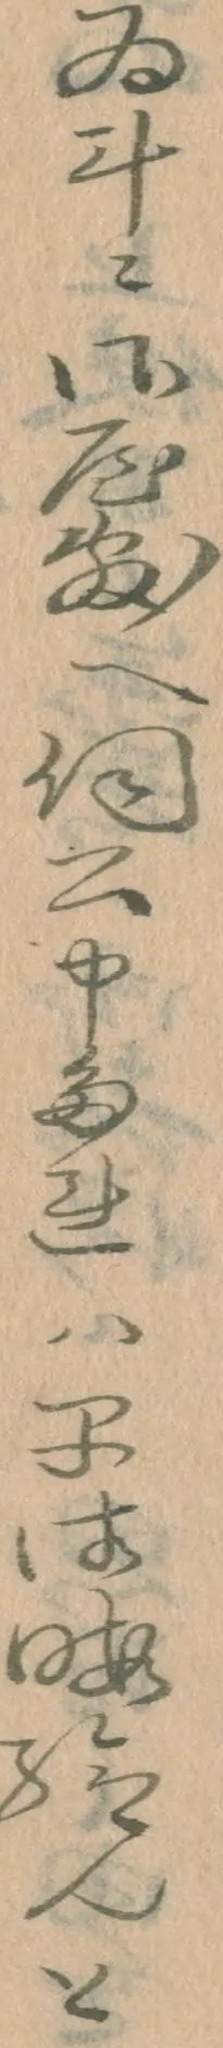ゐ斗に御屋敷へ伺公申多連は早御暇給んと
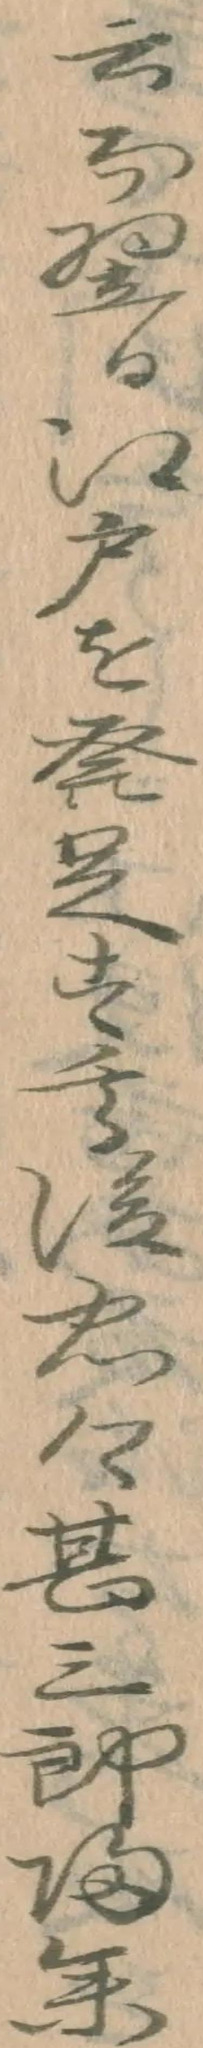云而翌日江戸を発足春其後忠郷甚三郎帰参
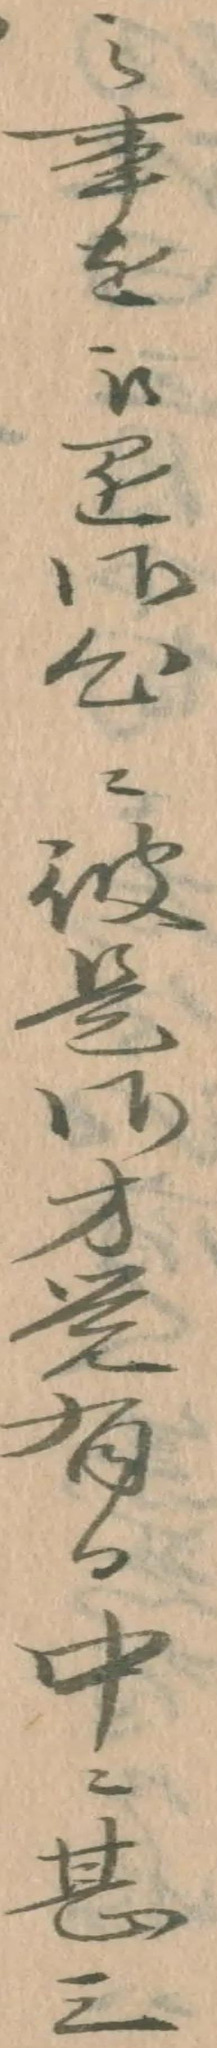之事を被懸御心に彼是御才覚有る中に甚三
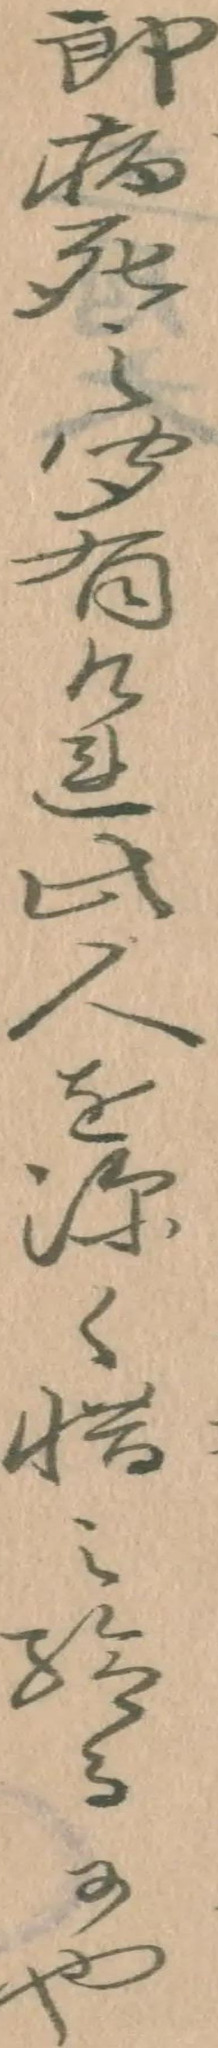郎病死之聞有け連此人を深く惜之給る尓也
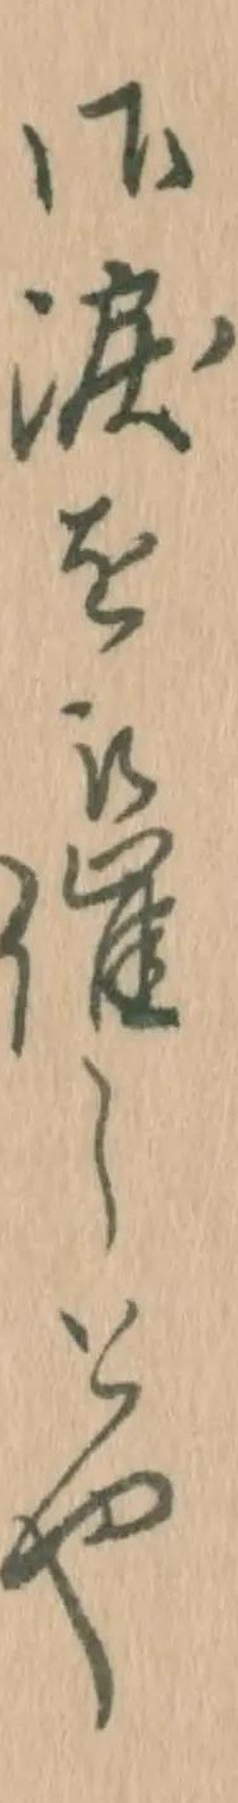御涙を被催しと也
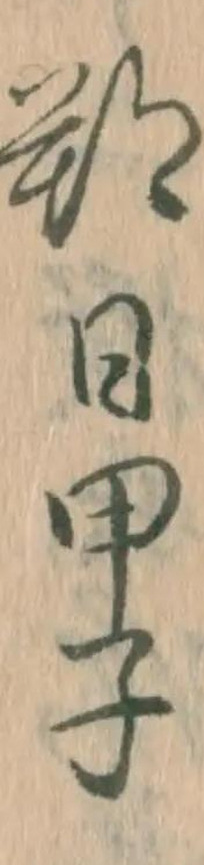朔日甲子
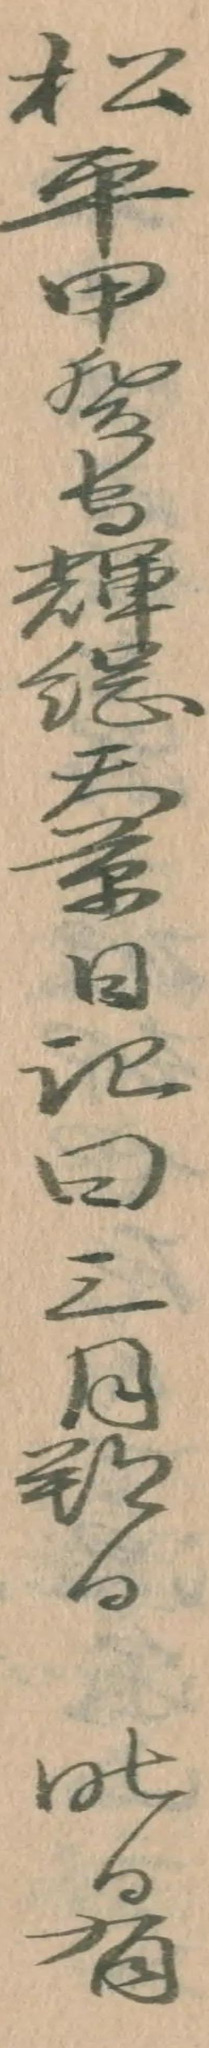松平甲斐守輝綱天草日記曰三月朔日昨日有
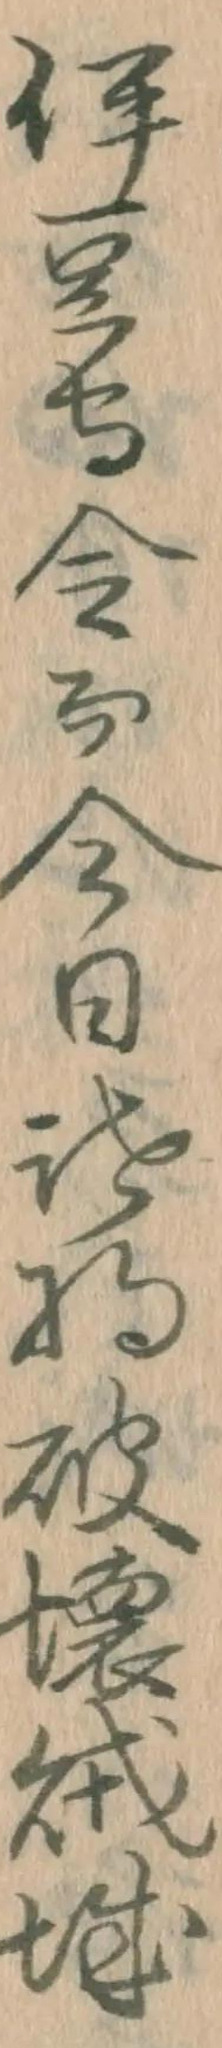伊豆守令而今日諸将破壊賊城
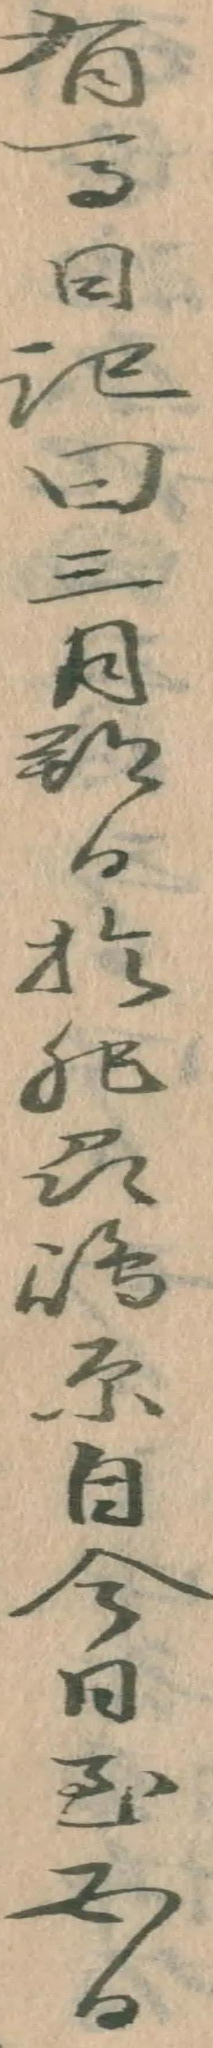有馬日記曰三月朔日於肥州島原自今日至五日
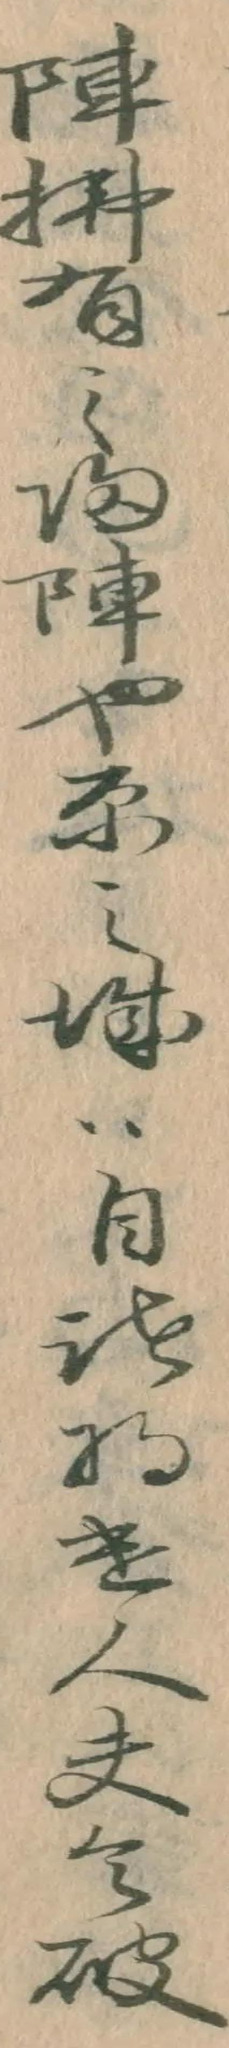陣掛有之帰陣也原之城は自諸将遣人夫令破
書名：切支丹御退治記 49巻. [9]
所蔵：国立国会図書館 National Diet Library, JAPAN
